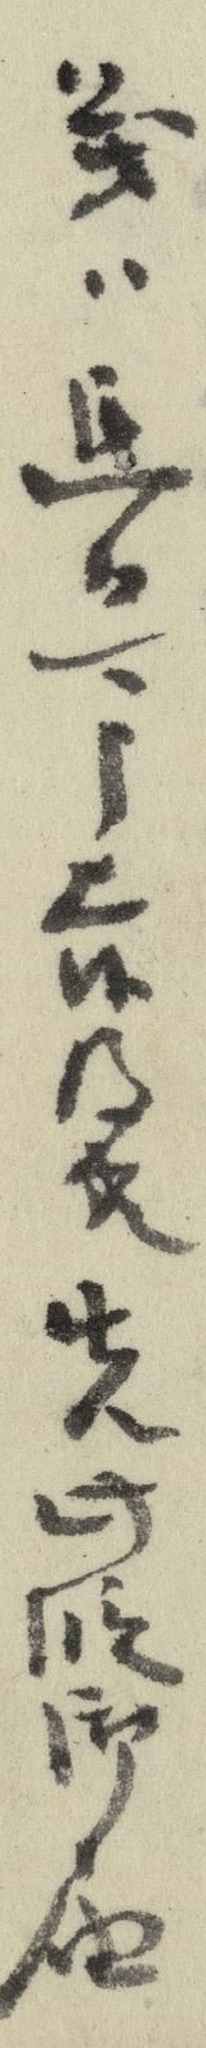義ハ追而可申上候得共先此段御届

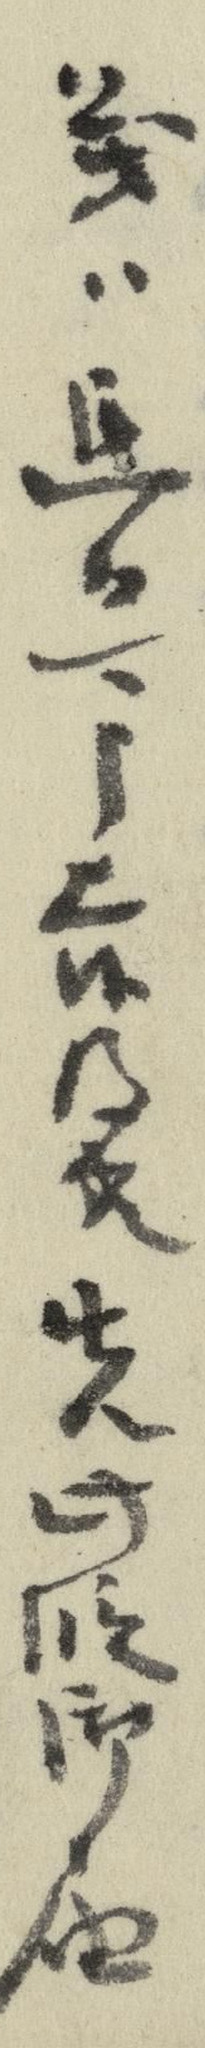取調之上追而可申上候先此段御届
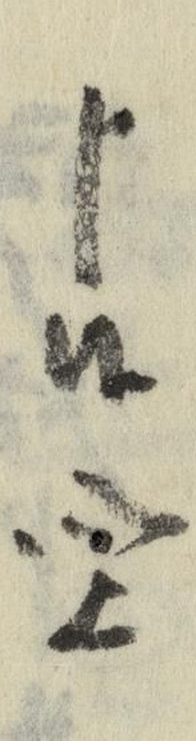申候以上
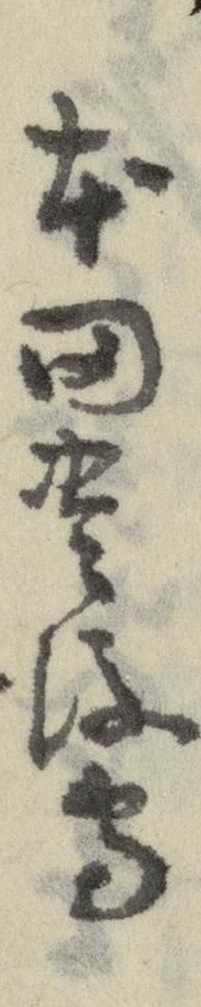本田豊後守
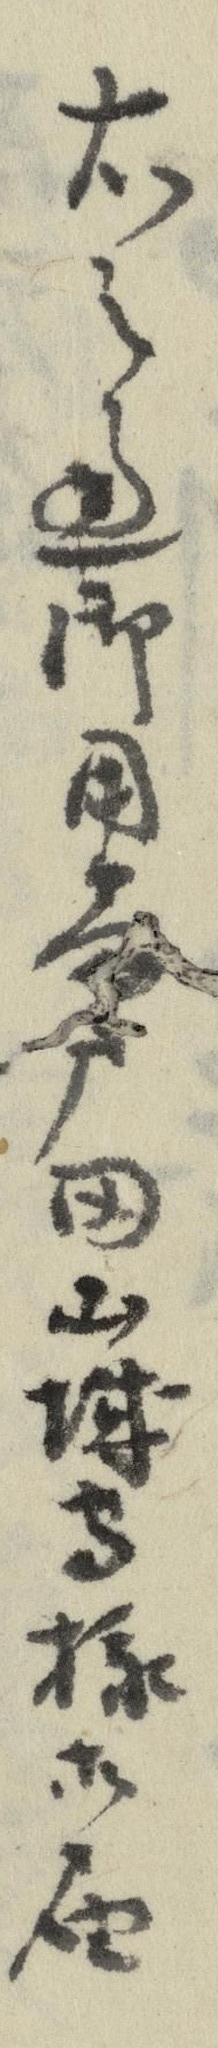右之通御用番戸田山城守様御届
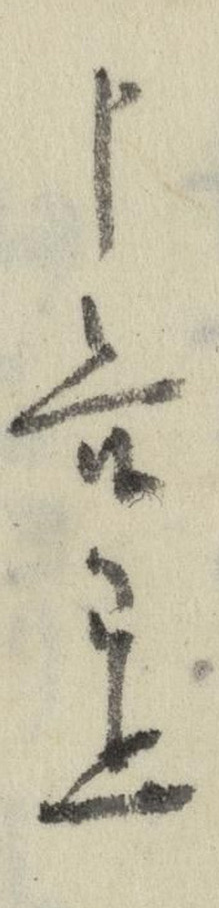申上候已上
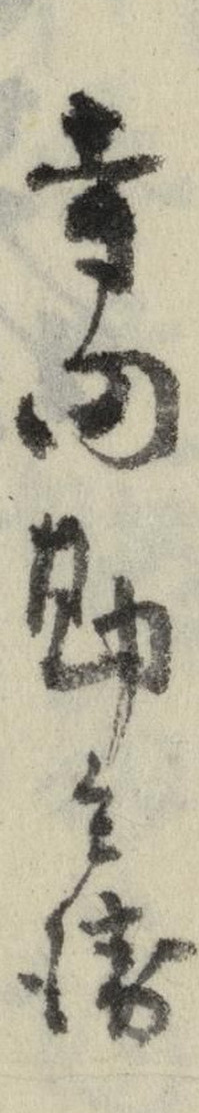寺田勘兵衛
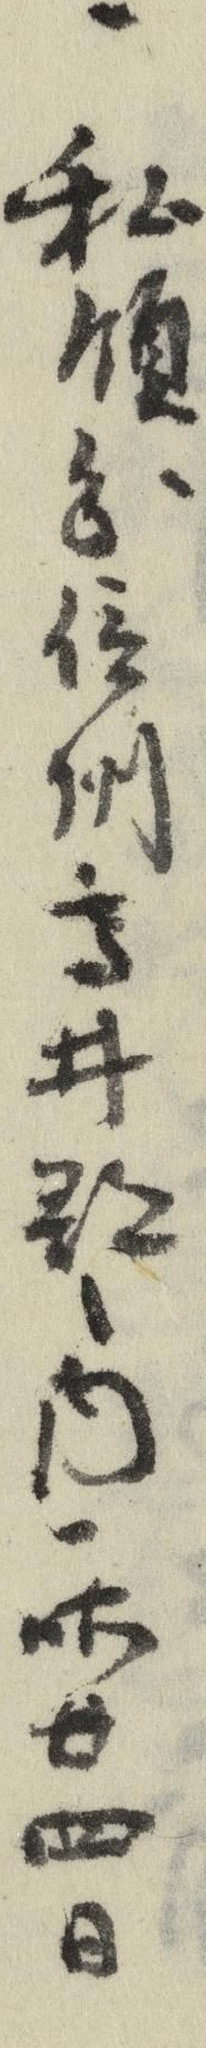一私領分信州高井郡之内一昨廿四日
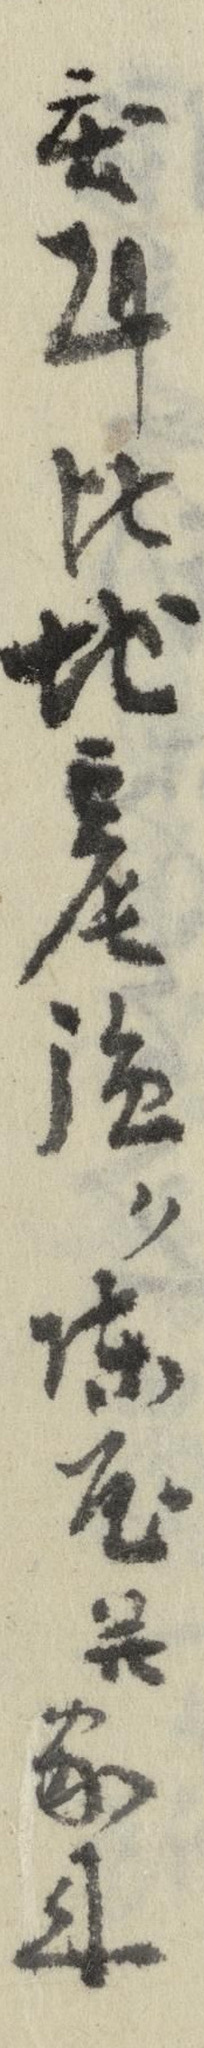亥刻比地震強ク陣屋并家来
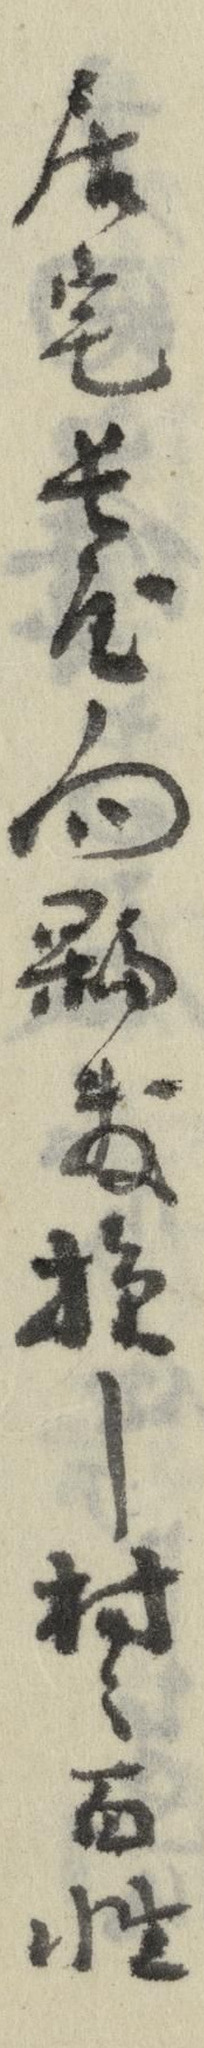居宅長屋向夥敷損し村々百姓
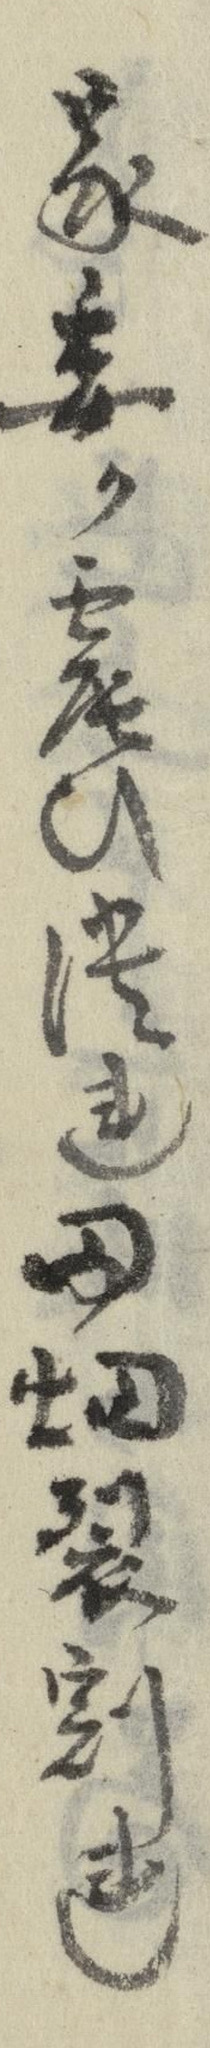家悉ク震ひ潰れ田畑裂割れ
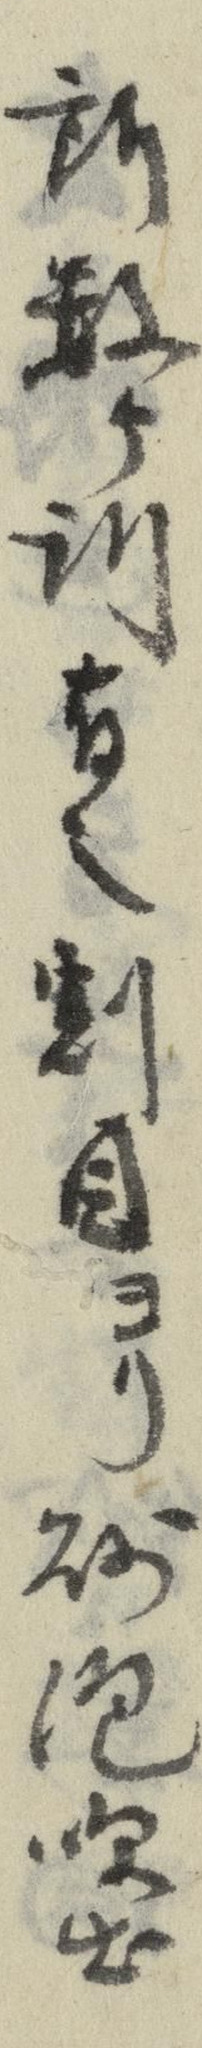所数ヶ所有之割目ヨリ砂泥吹出
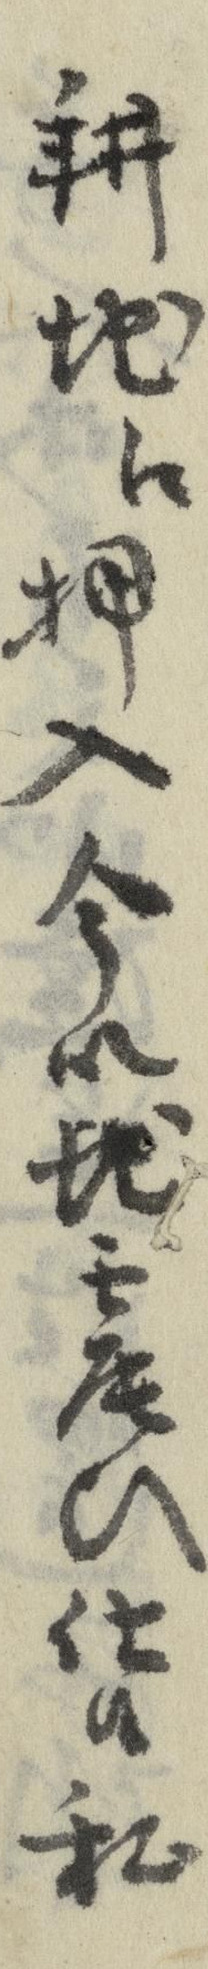耕地江押入今以地震ひ仕候私
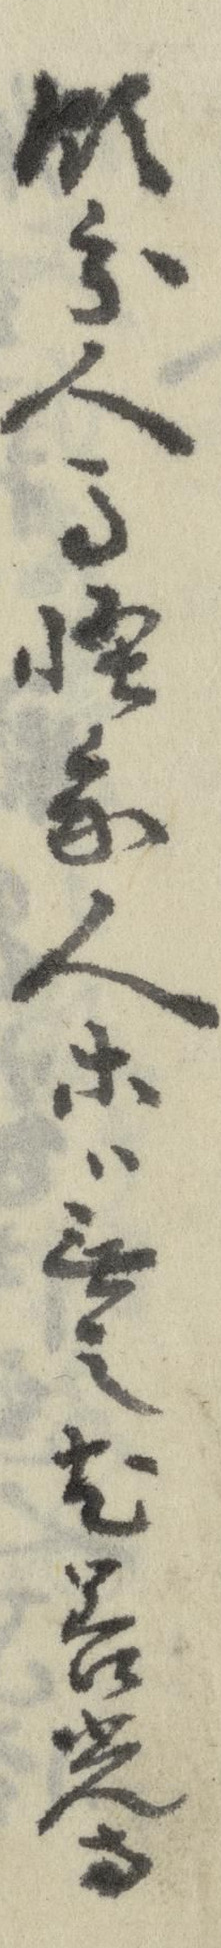領分人馬怪我等無之尤善光寺
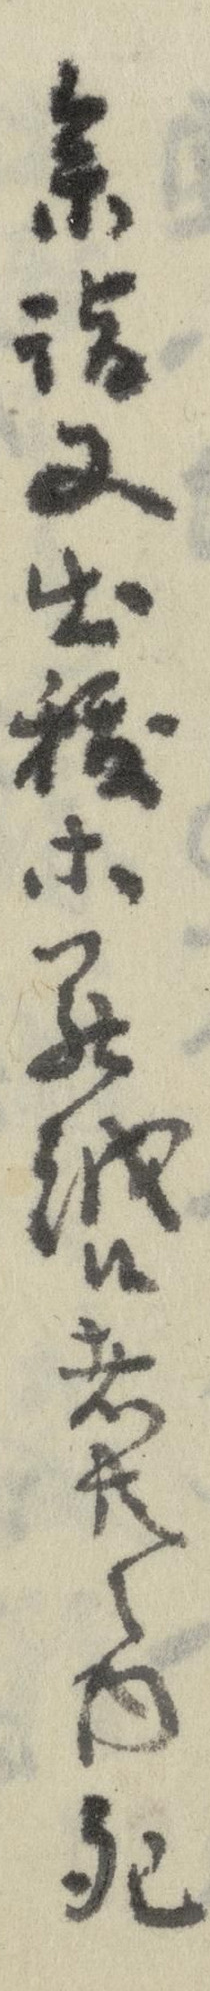参詣又出稼等罷越候者共之内死
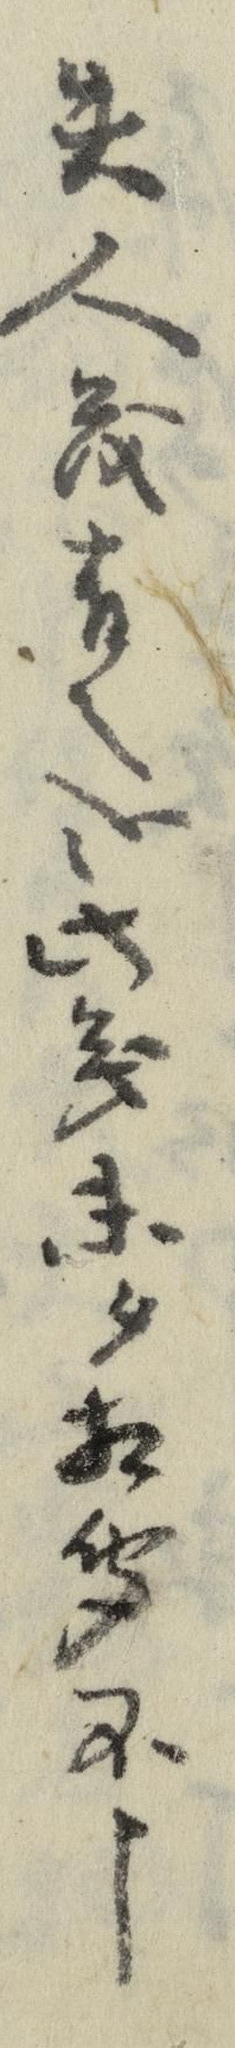失人も有之哉此義未タ相聞不申
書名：信州大地震一件之冩　丁未弘化四年三月吉日
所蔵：東京大学地震研究所図書室 Earthquake Research Institute Library, The University of Tokyo, JAPAN
